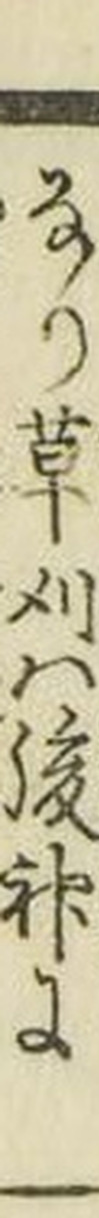なり草刈は後神に
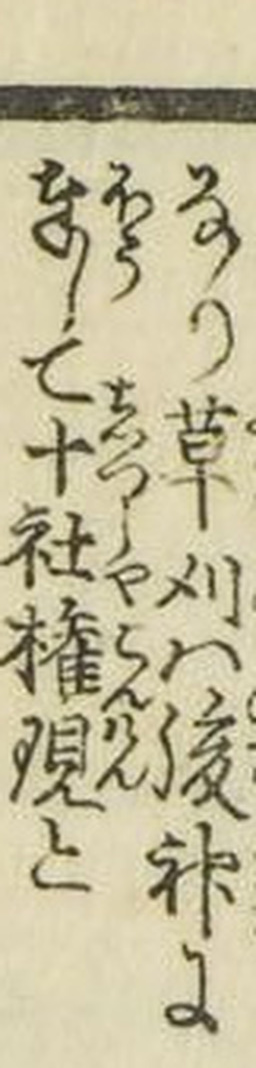奉して十社権現と
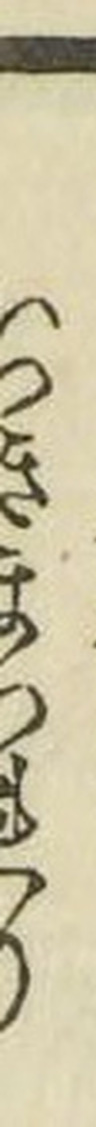いつきまつれり
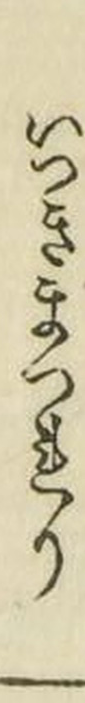いつきまつれり

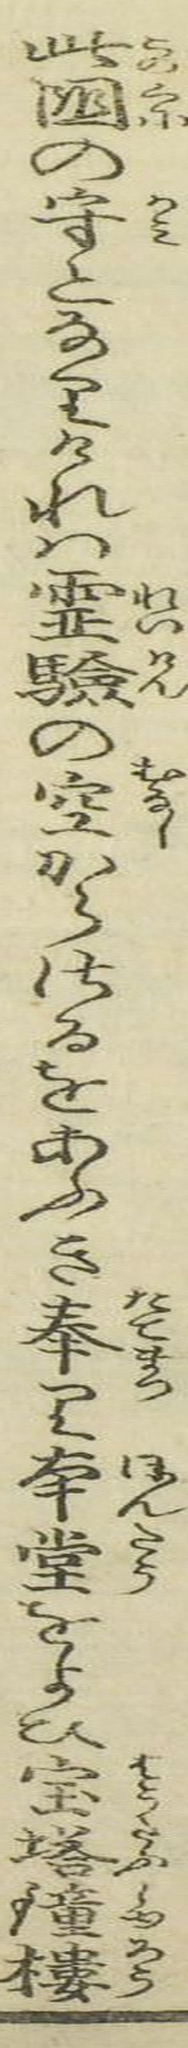此国の守となりけれは霊験の空からさるをあふき奉り本堂をよひ宝塔鐘楼
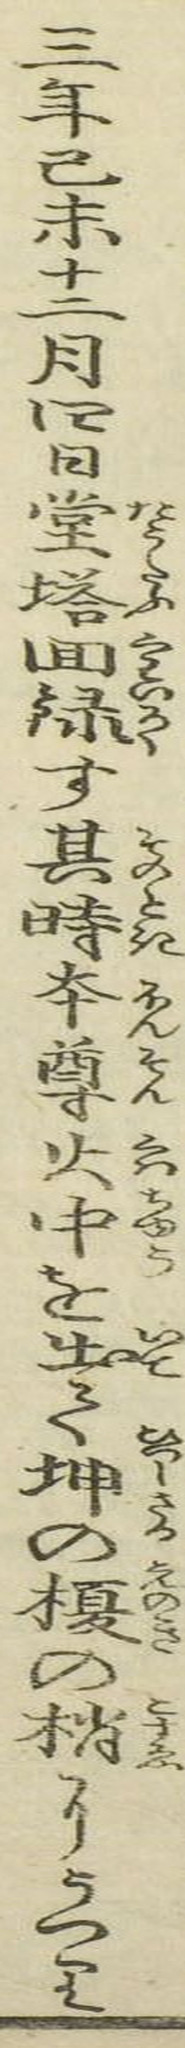三年己未十二月四日堂塔回禄す其時本尊火中を出て坤の榎の梢にうつり
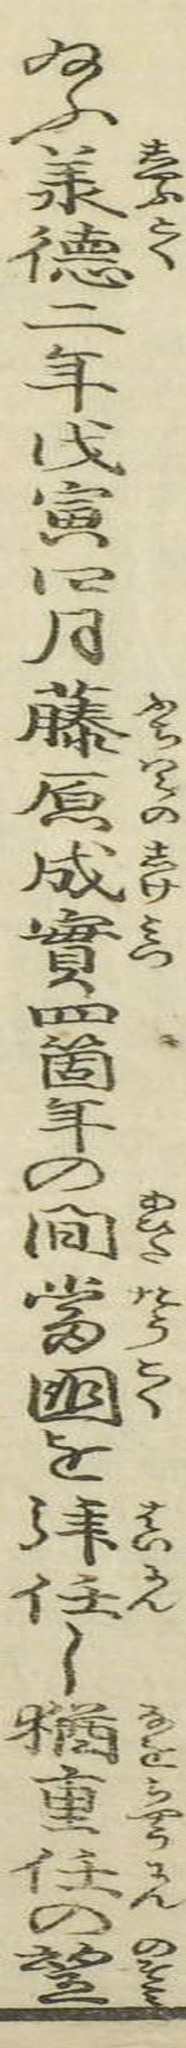給ふ承徳二年戊寅四月藤原成実四箇年の間当国を拝任し猶重任の望
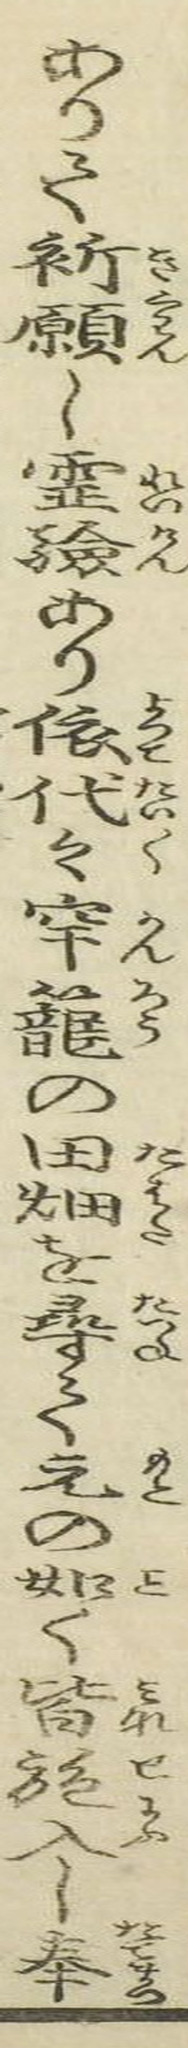ありて祈願し霊験あり依代々罕籠の田畑を尋て元の如く皆施入し奉
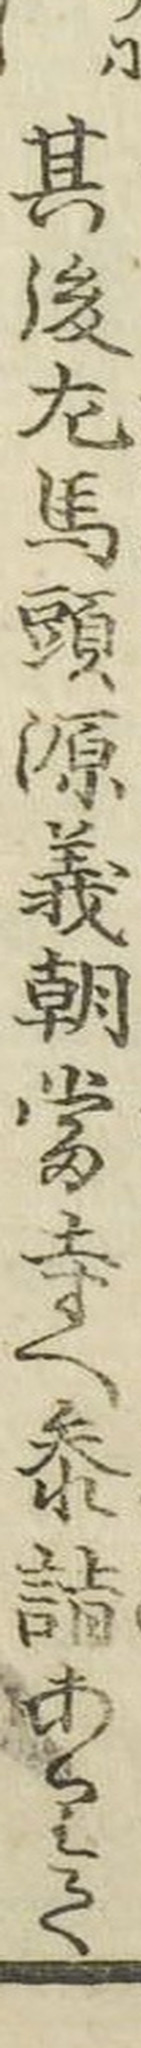其後左馬頭源義朝当寺へ参詣ありて
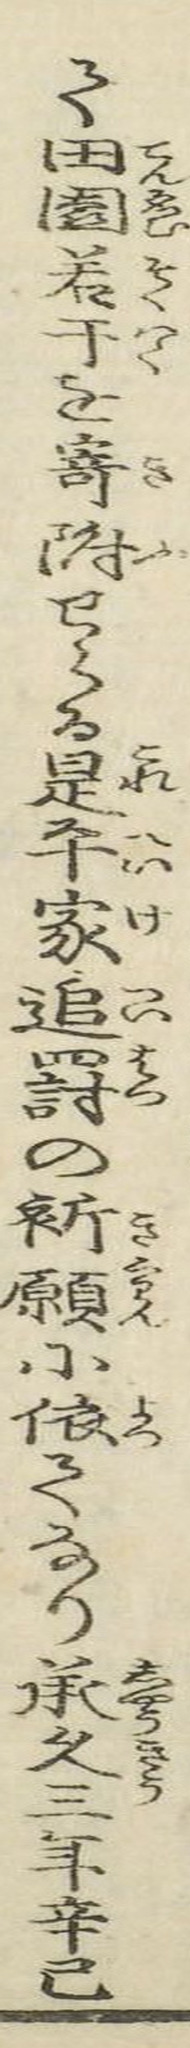て田園若干を寄附せらる是平家追罰の祈願に依てなり承久三年辛巳
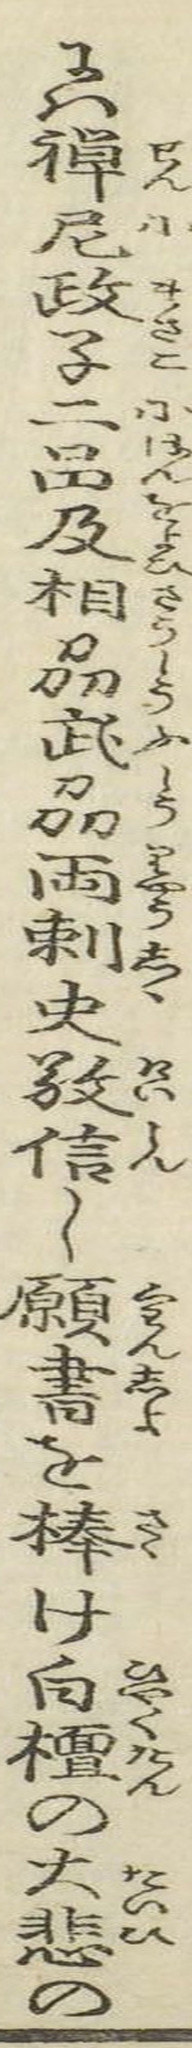には禅尼政子二品及相州武州両刺史敬信し願書を棒け白檀の大悲の
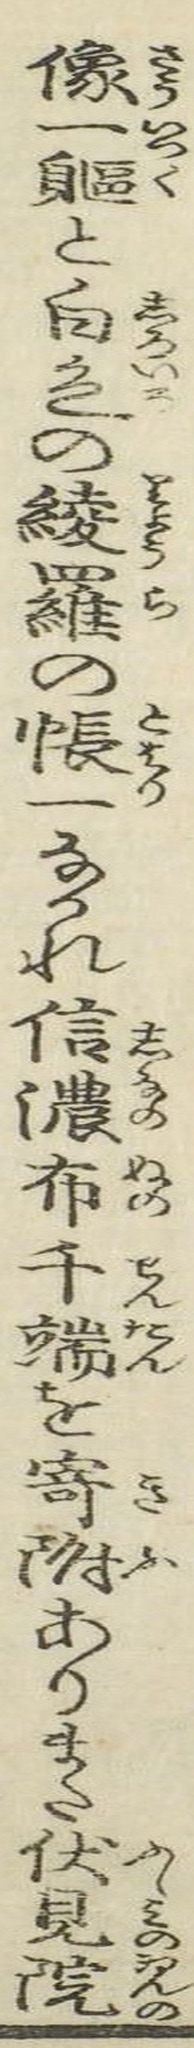像一躯と白色の綾羅の帳一なかれ信濃布千端を寄附ありまた伏見院
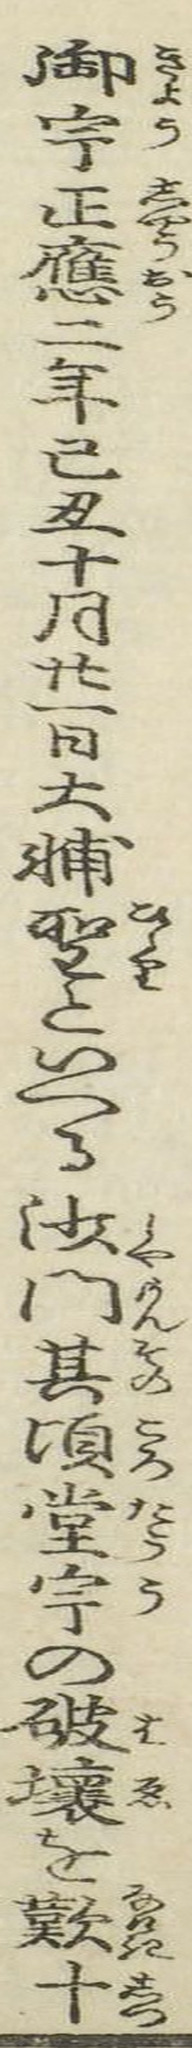御宇正応二年己丑十月廿一日大輔聖といへる沙門其頃堂宇の破壊を歎十
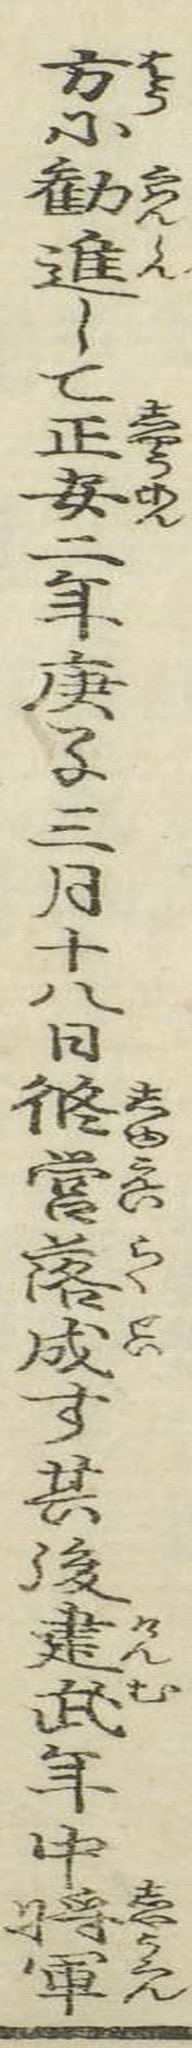方に勧進して正安二年庚子三月十八日修営落成す其後建武年中将軍
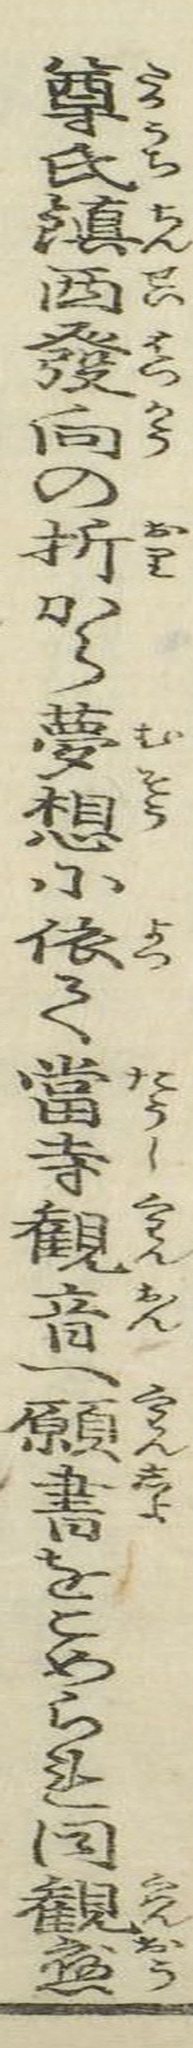尊氏鎮西発向の折から夢想に依て当寺観音へ願書をこめられ同観応
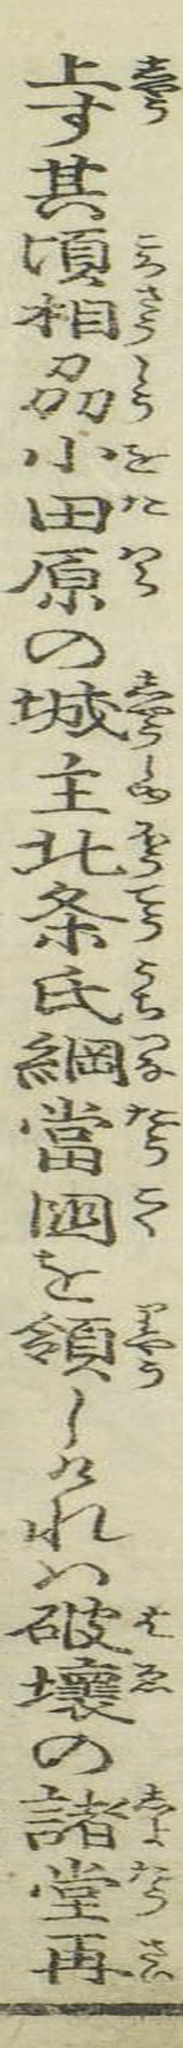上す其頃相州小田原の城主北条氏綱当国を領しけれは破壊の諸堂再
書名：江戸名所図会 20巻 巻之16
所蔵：東京学芸大学教育コンテンツアーカイブ
